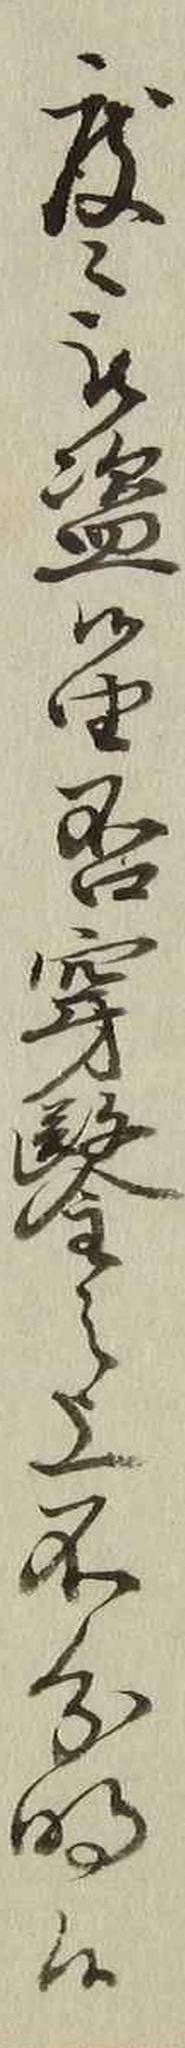度々被盗候由否穿鑿之上不分明候
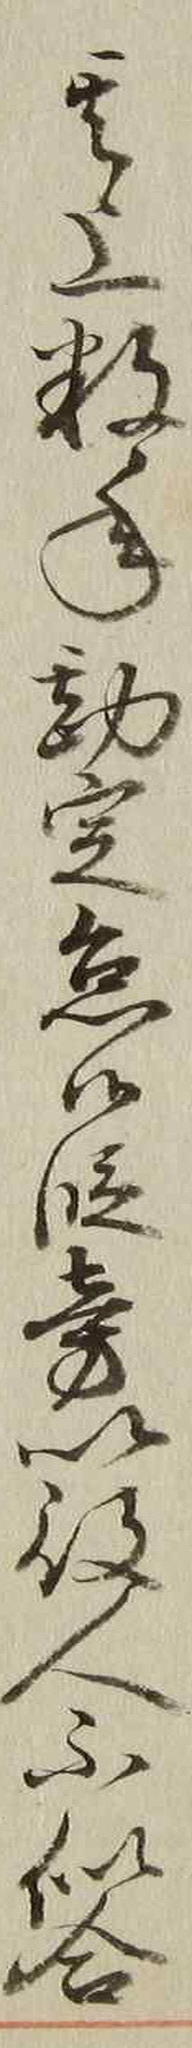其上数年勘定怠候段旁以役人不似合
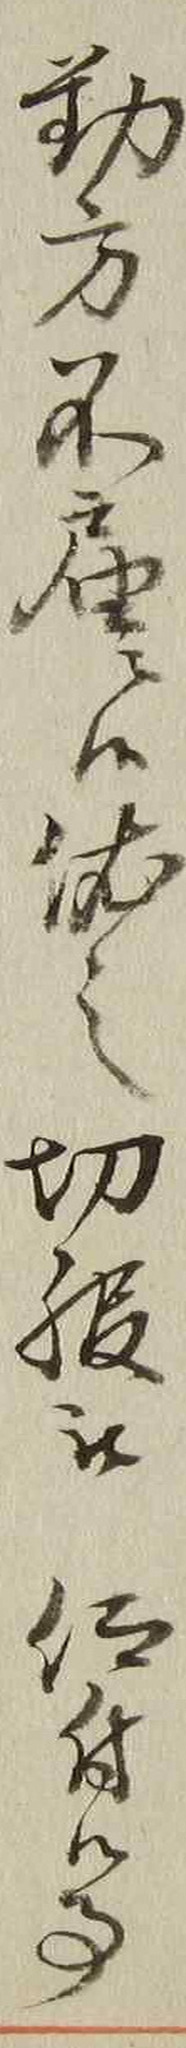勤方不届ニ候依之切服被仰付候事
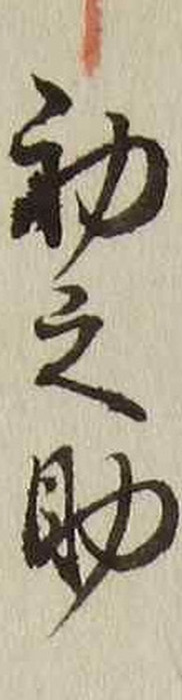初之助
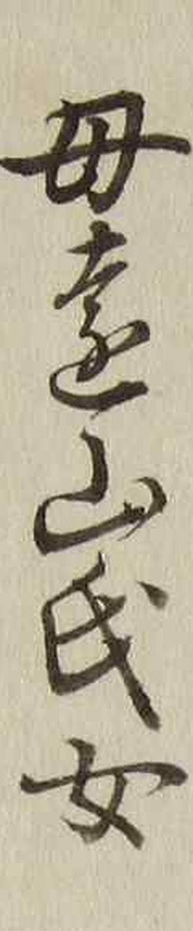母遠山氏女
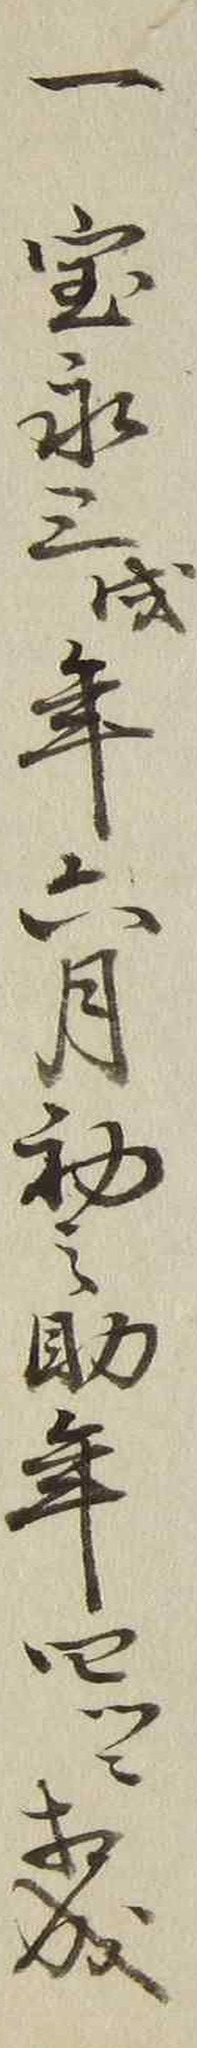一宝永三戌年六月初之助年四ツニ相成
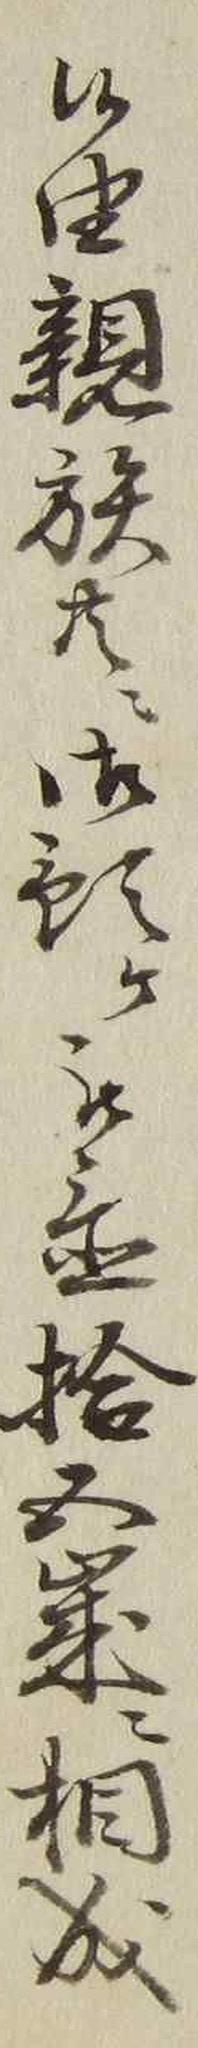候由親族共に御預ケ被置拾五歳ニ相成
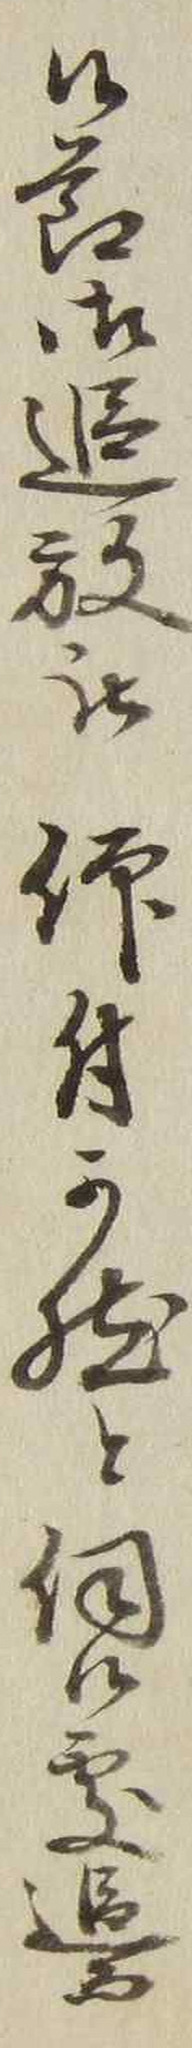候節御追放被仰付可然と伺候処追而

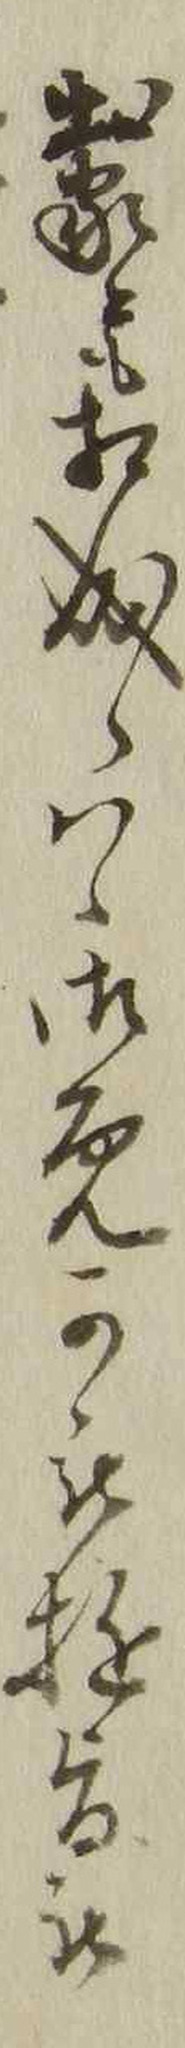出家ニも相成候ハヽ御免可被遊旨被
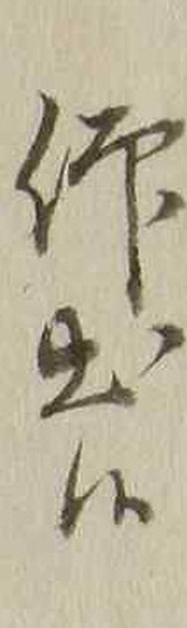仰出候
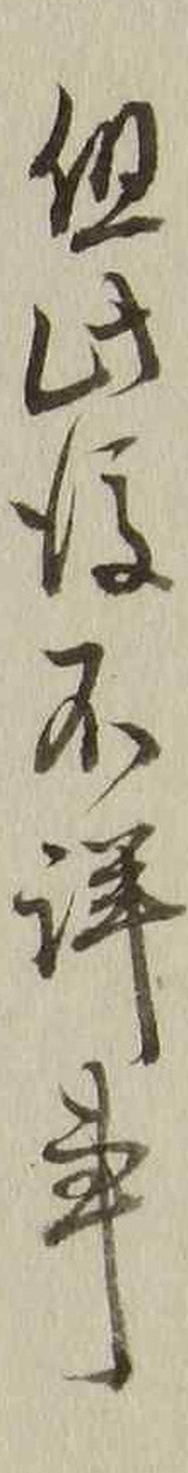但此後不詳事
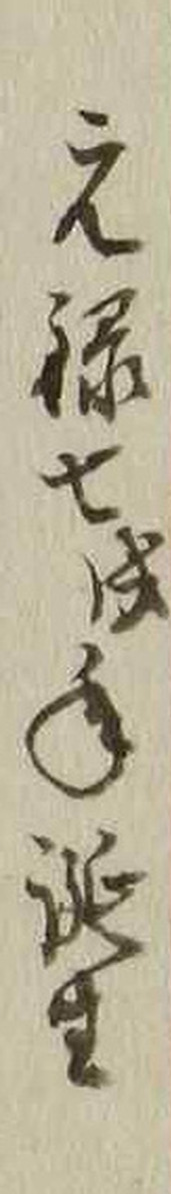元禄七戌年誕生
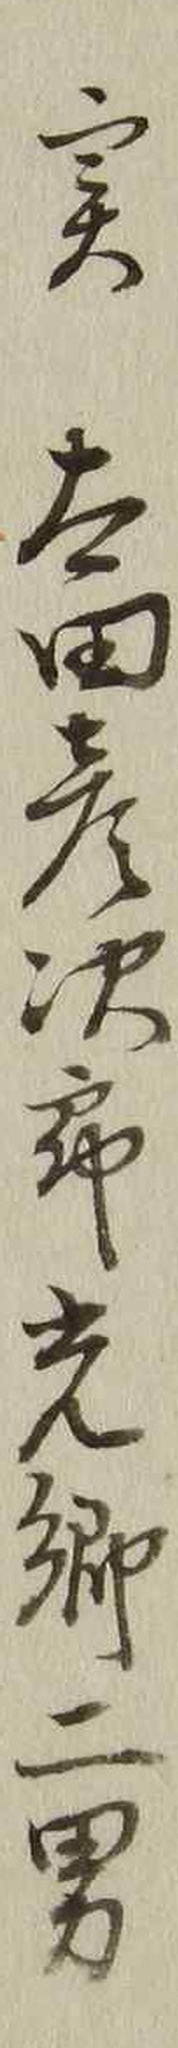実太田彦次郎光卿二男
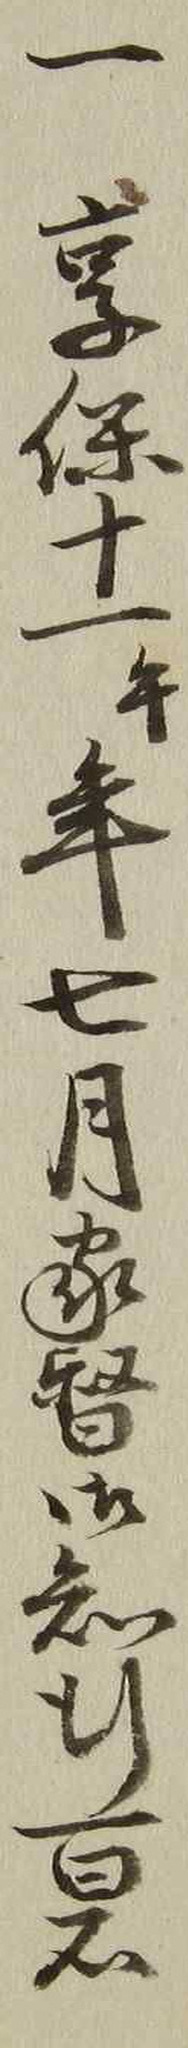一享保十一午年七月家替御知行百石
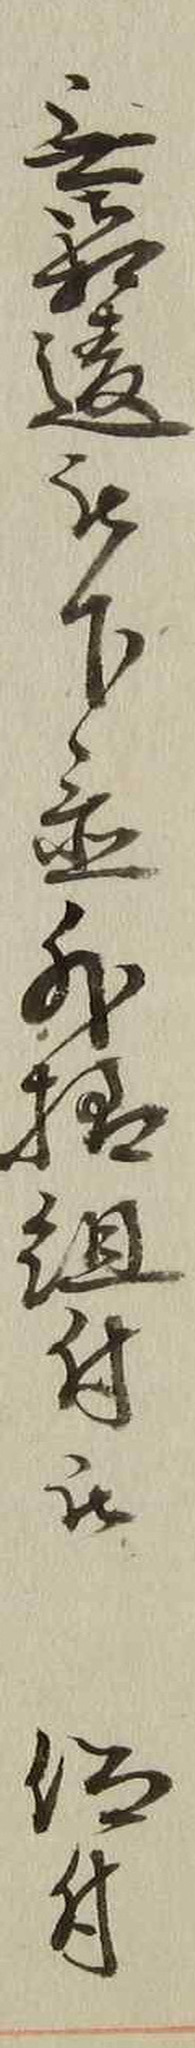無御相違被下置外様組付被仰付
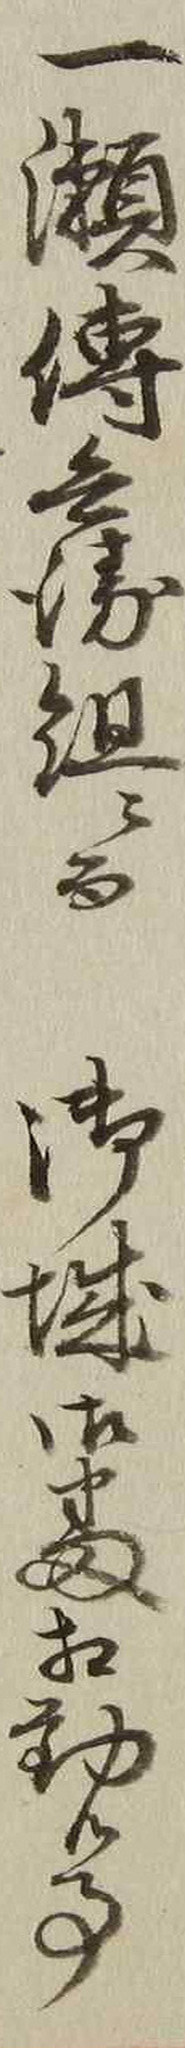一瀬伝兵衛組ニ而御城御番相勤候事
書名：諸士系譜　巻之27　い之部27
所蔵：会津若松市立会津図書館
